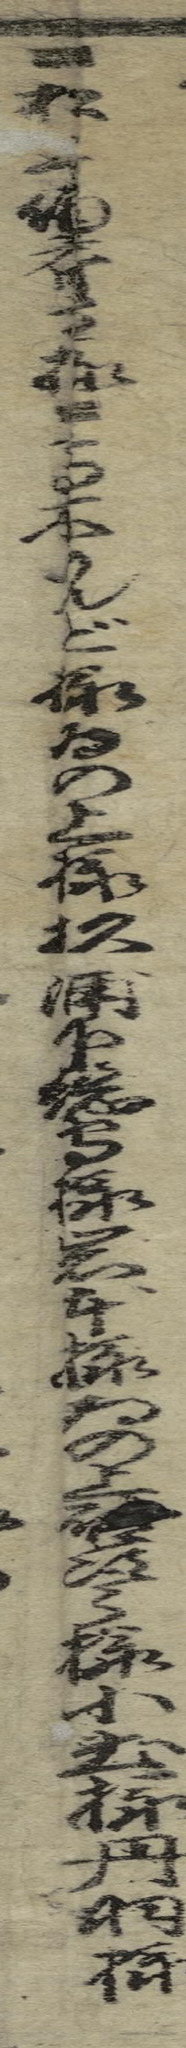松平備前守様高木もんど様ゐの上様杉浦下総守様岡本様ゐの上磯次郎様小出様丹羽様
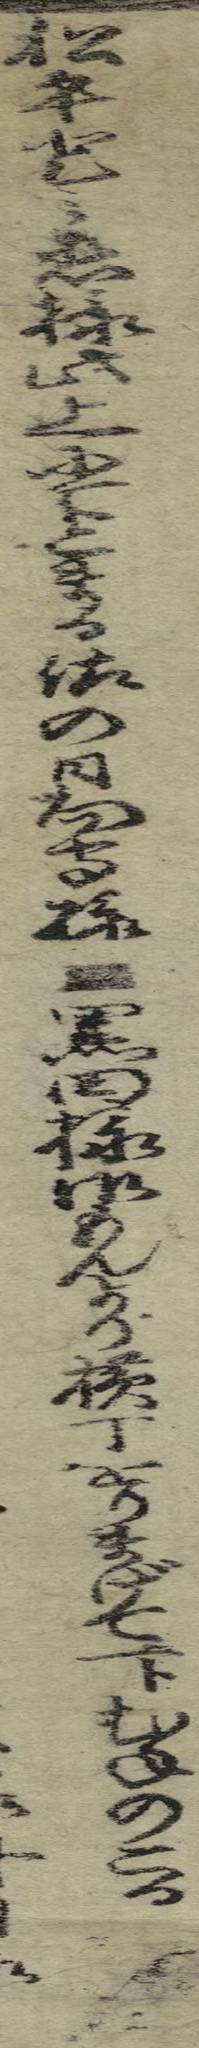松平登之丞様此上にてとまる佐の日向守様黒田様御もんより横丁をりまげて一トむねのこる
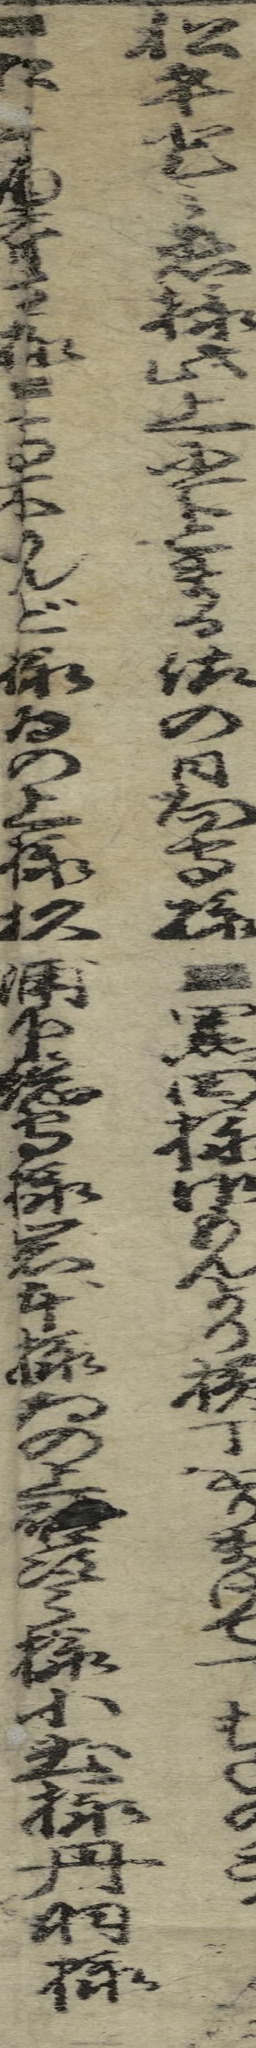松平備前守様高木もんど様ゐの上様杉浦下総守様岡本様ゐの上磯次郎様小出様丹羽様
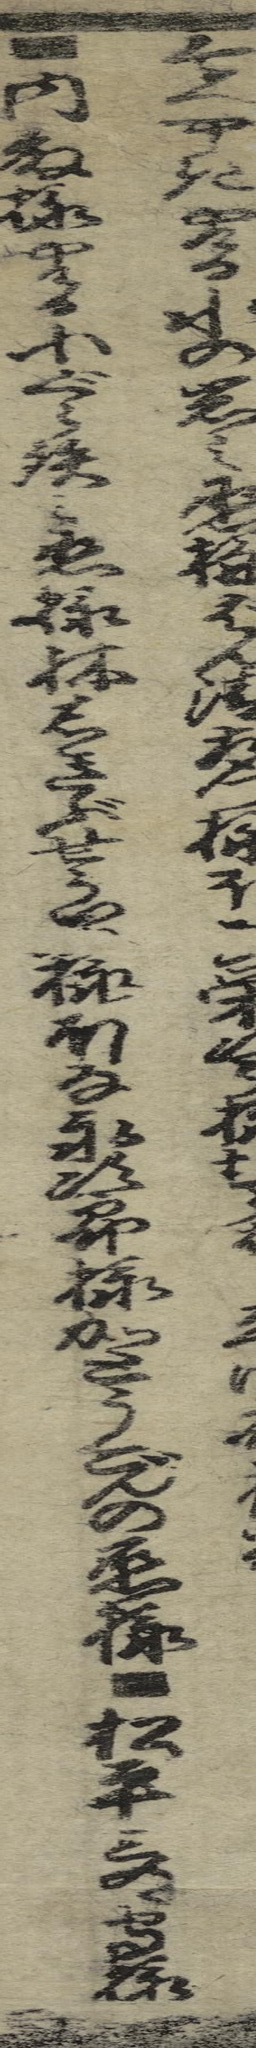内藤様やける小ぐら鉄之丞様林しきぶせういふ様ほな永次郎様かとうごんの丞様松平みのゝ守様
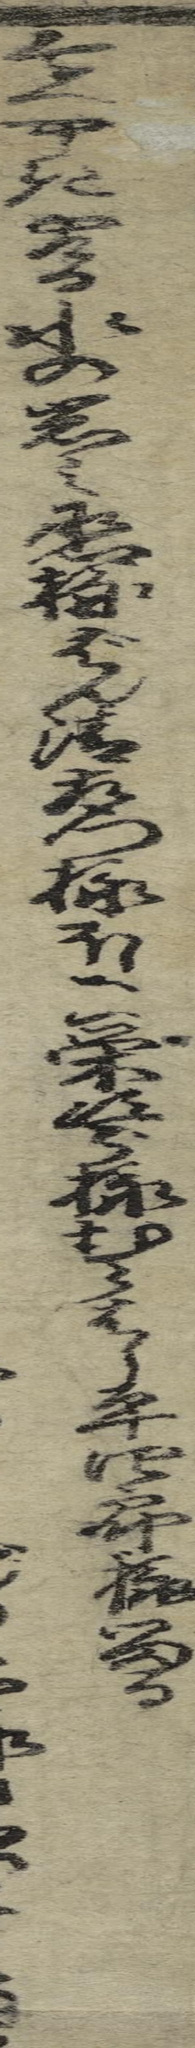御てんやしきやける水の岩之丞様ばん清左衛門様ほな栄次郎様むらはし平四郎様留る
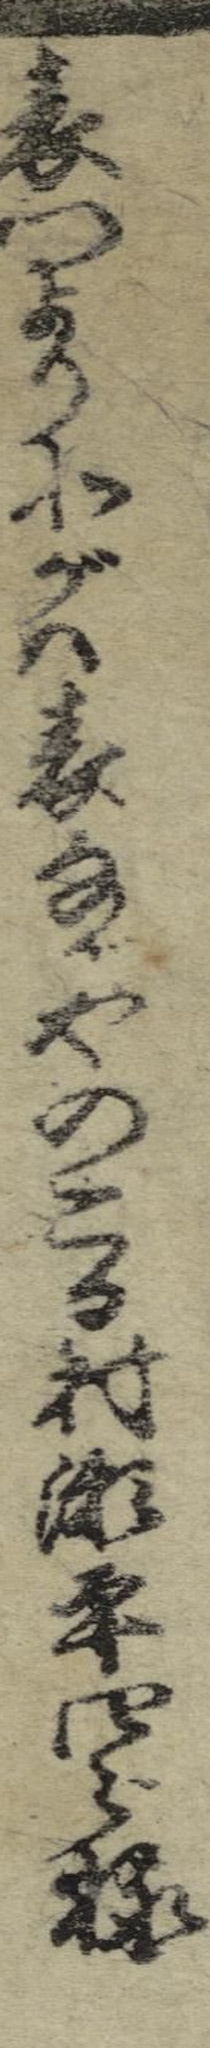表門より北がは表なやのこる村瀬平四郎様
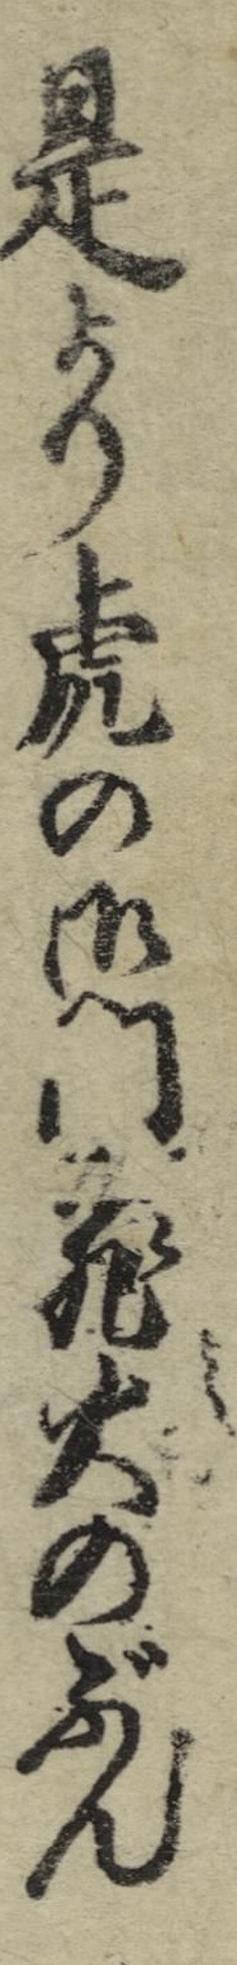是より虎の御門飛火のぶん
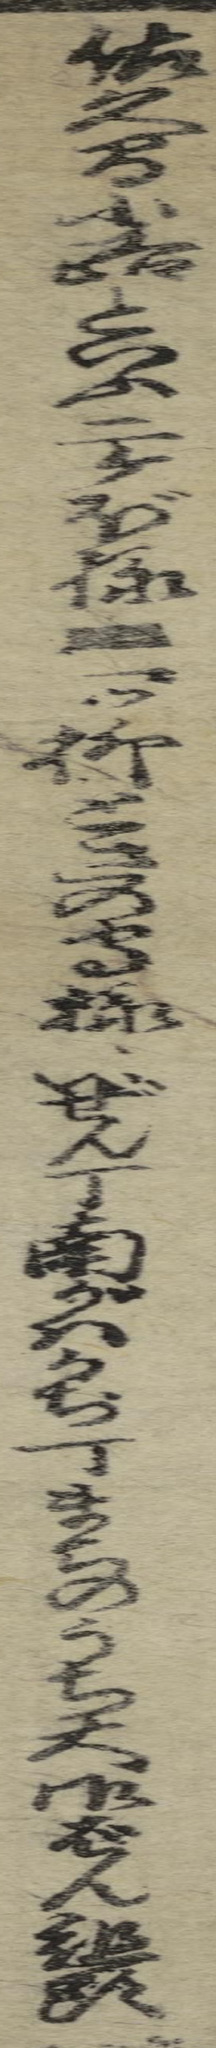佐久間小路といふニケぼ様一ツ柳ときの守様びぜん丁南がはかぢ丁まちのうち大御ばん組頭
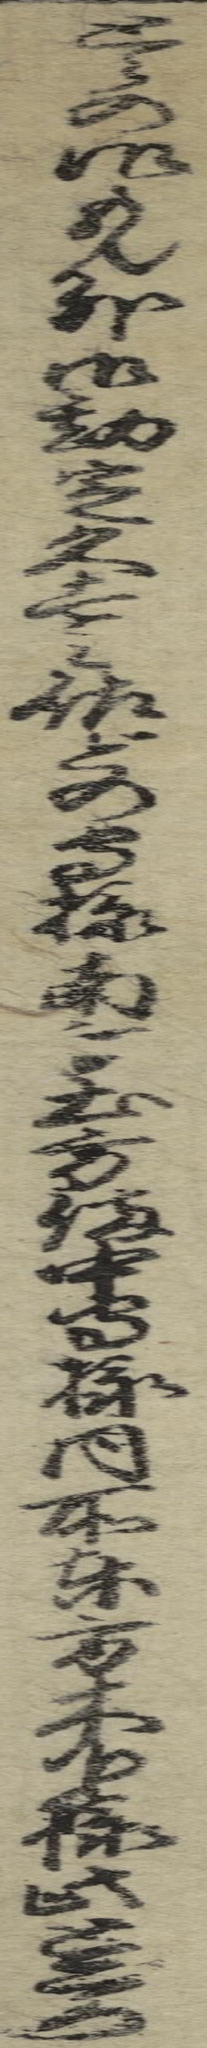とらの御もん外御勘定久遠佐どの守様南方土方備中守様同所東方木下様此ところ
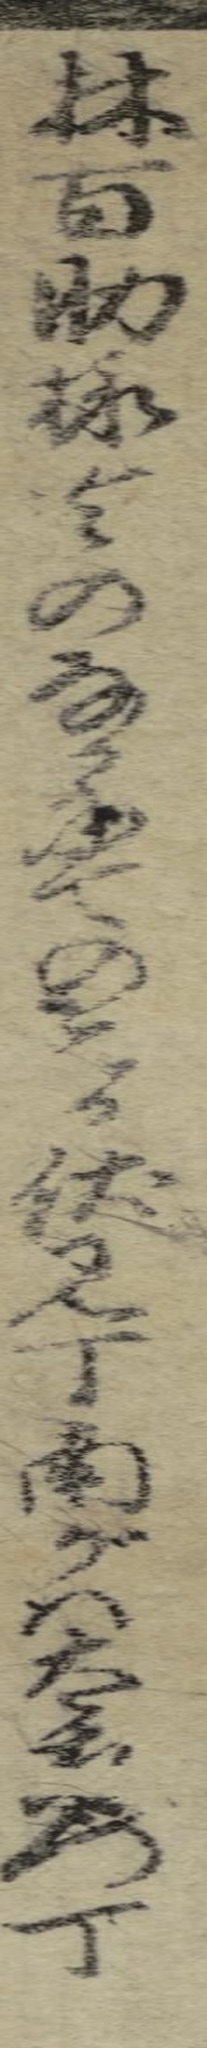林百助様其のなかにてのこる伏見丁南がは大左衛門丁
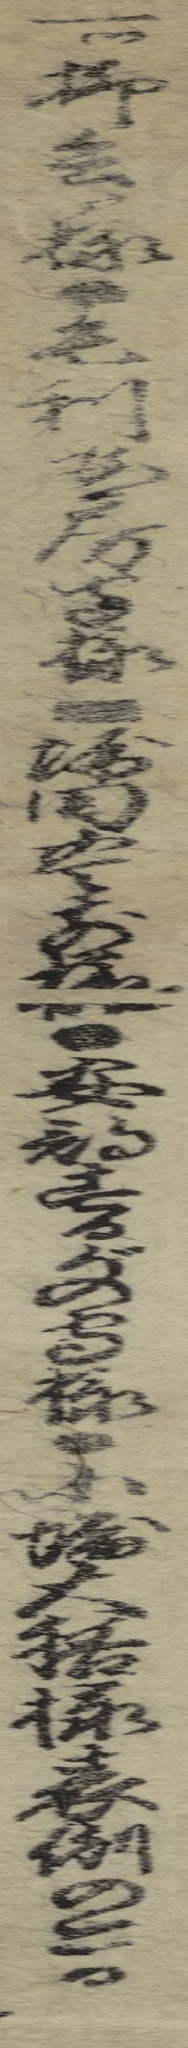一ツ柳兵部様●毛利安房守様堀田豊前守様安部するがの守様●小堀大膳様表側のこる
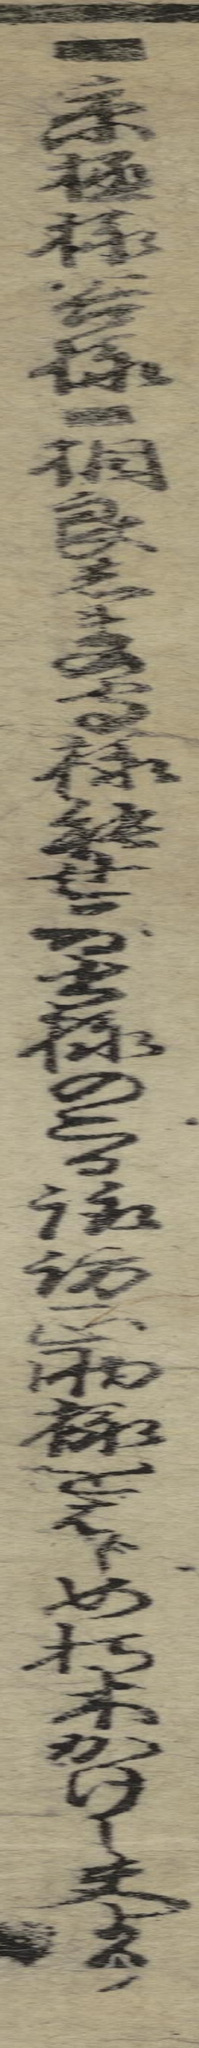京極様谷様相良しまの守様のせ図書様のこる諏訪正助様をはじめ朽木かけし夫より
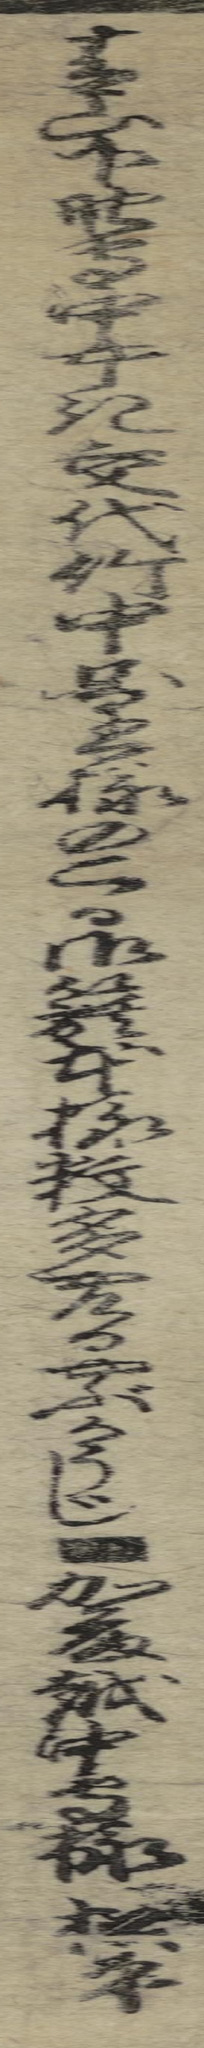青山下野守中やしき交代竹中図書様のこる御籏本様数多やけるやぶかうじ加藤越中守様松平
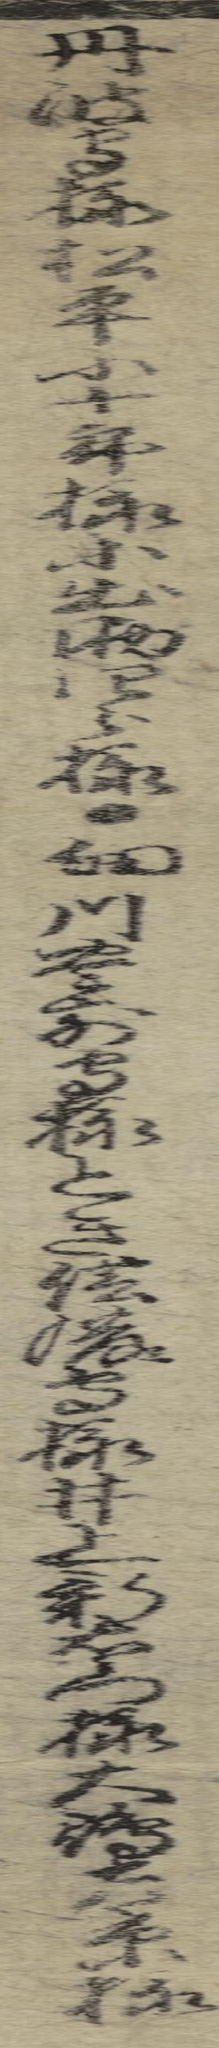丹波守様松平小十郎様小出助四郎様●細川豊前守様とき信濃守様井上新右衛門様大嶋左京様
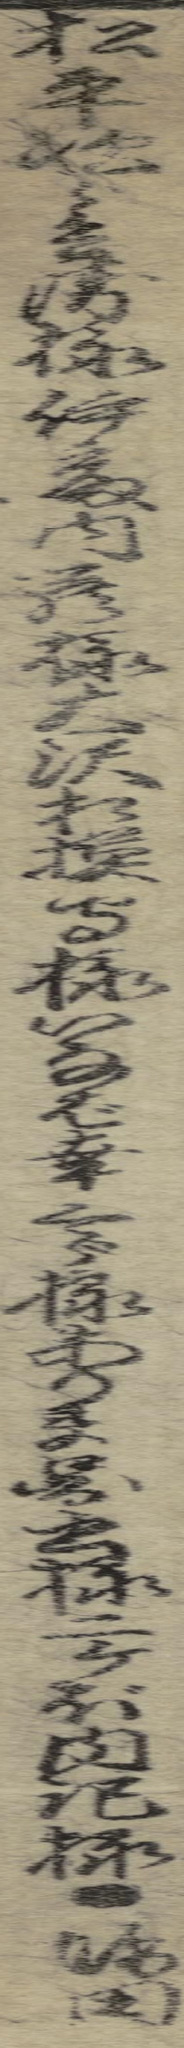松平治郎兵衛様伊藤内蔵様大沢相模守様いなば幸二郎様ありま図書様ニケぼ内記様●堀田
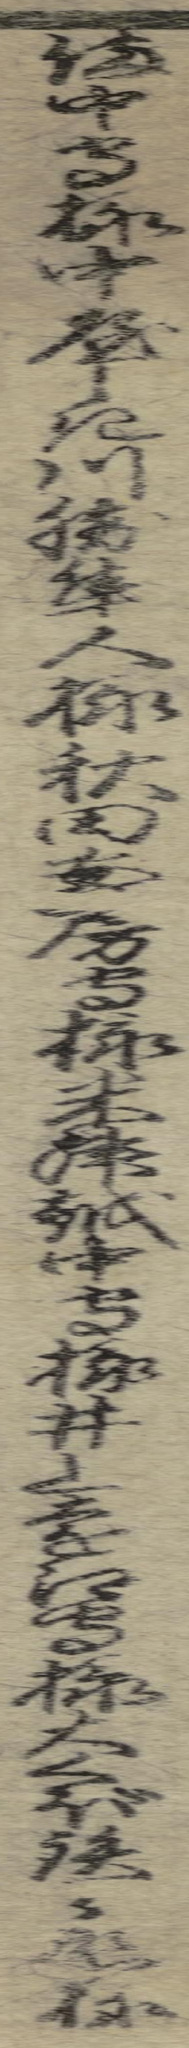備中守様中屋しき川勝隼人様秋田安房守様米津越中守様井上遠江守様大くぼ鉄之丞様
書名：[嘉永三年二月の江戸大火に関する瓦版]
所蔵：東京大学地震研究所図書室 Earthquake Research Institute Library, The University of Tokyo, JAPAN
